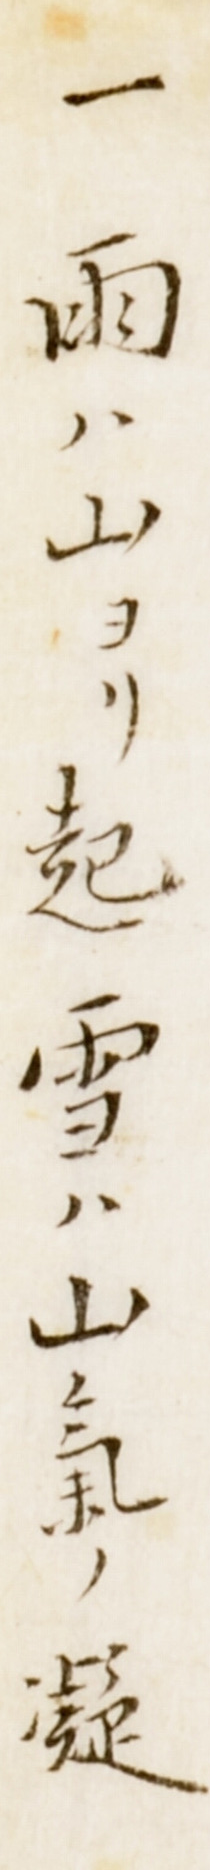一雨ハ山ヨリ起雪ハ山氣ノ凝
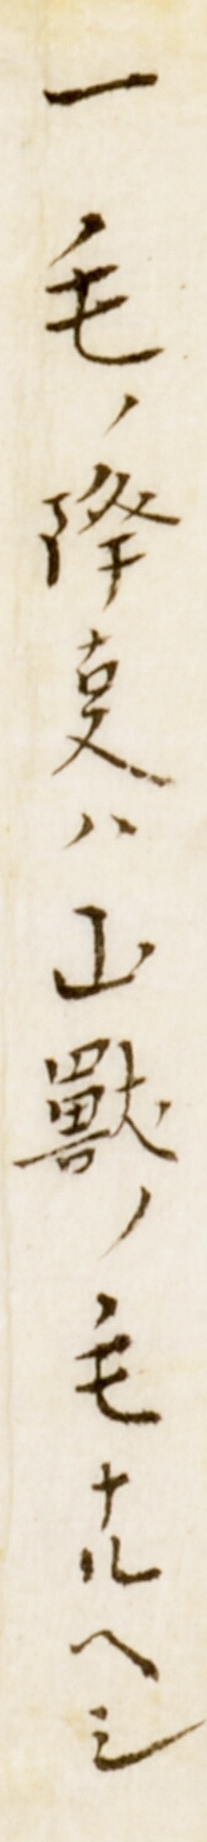一毛ノ降事ハ山獣ノ毛ナルへシ
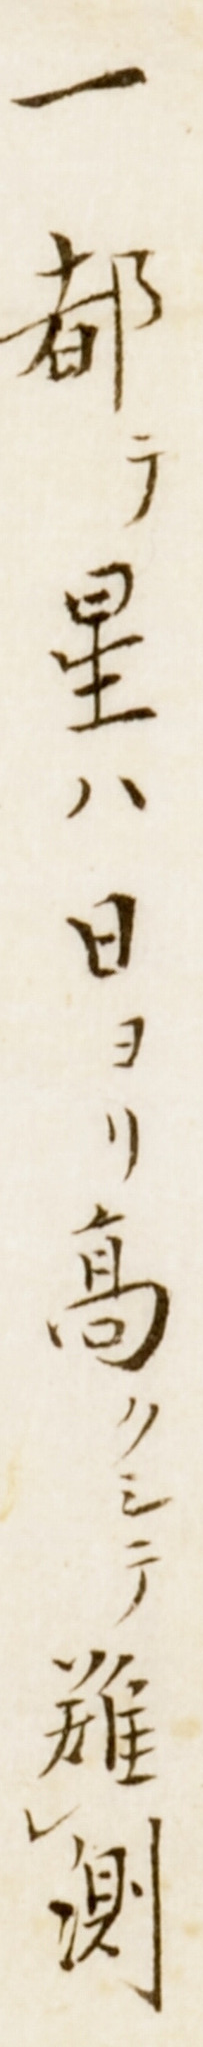一都テ星ハ日ヨリ高クシテ難測
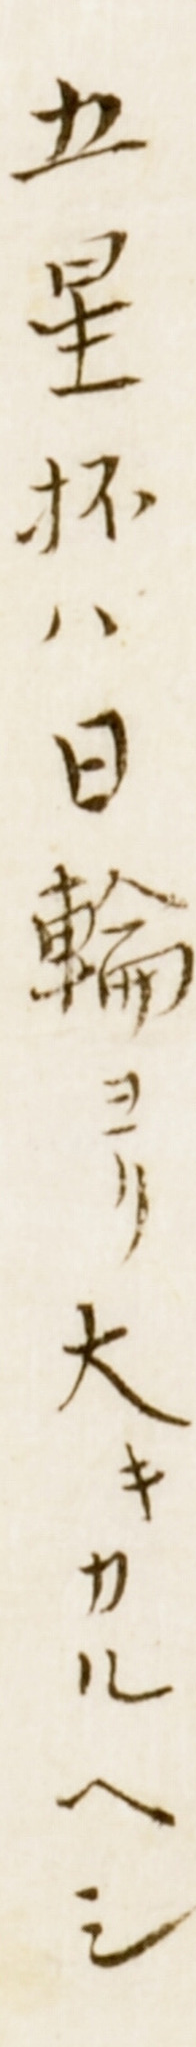五星杯ハ日輪ヨリ大キカルへシ
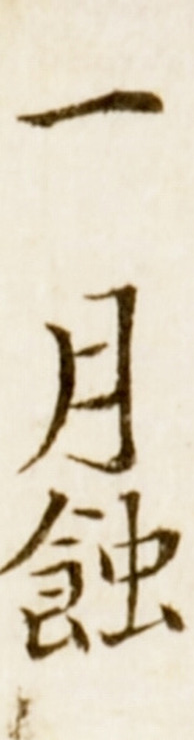一月蝕
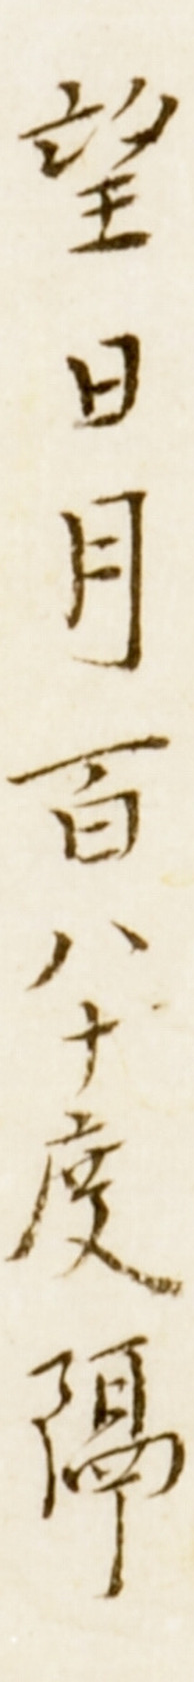望日月百八十度隔
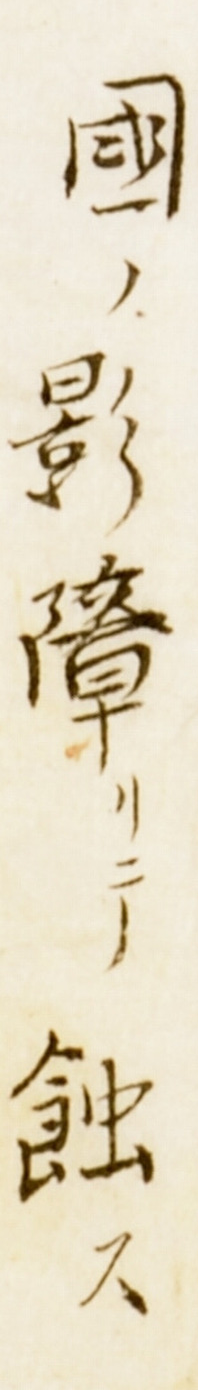國ノ影障リテ蝕ス
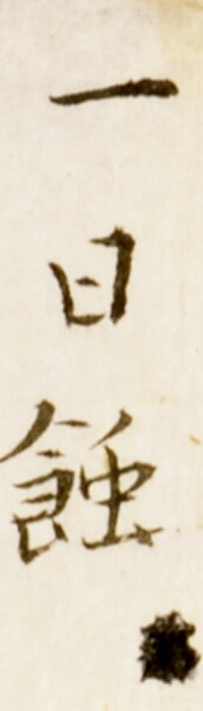一日蝕
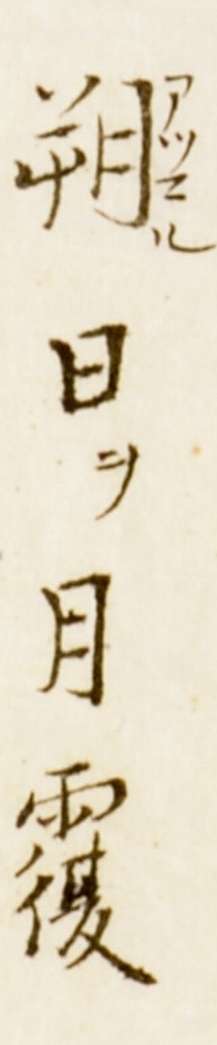朔日ヲ月覆
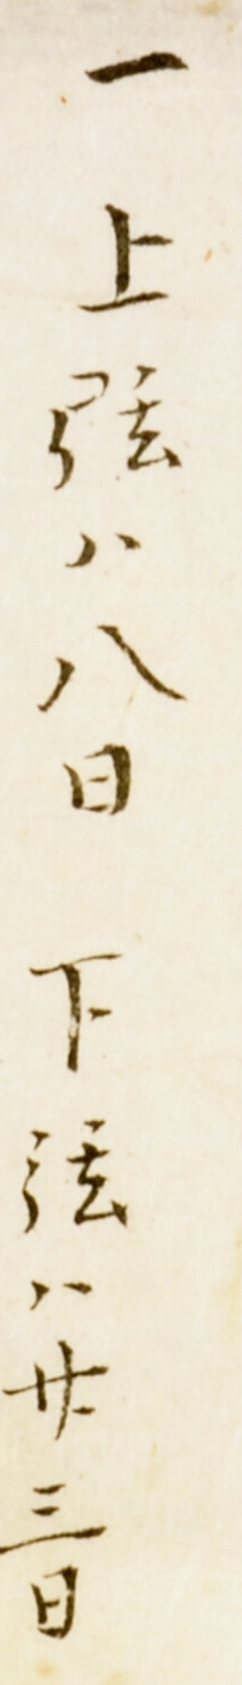一上弦ハ八日下弦ハ廿三日
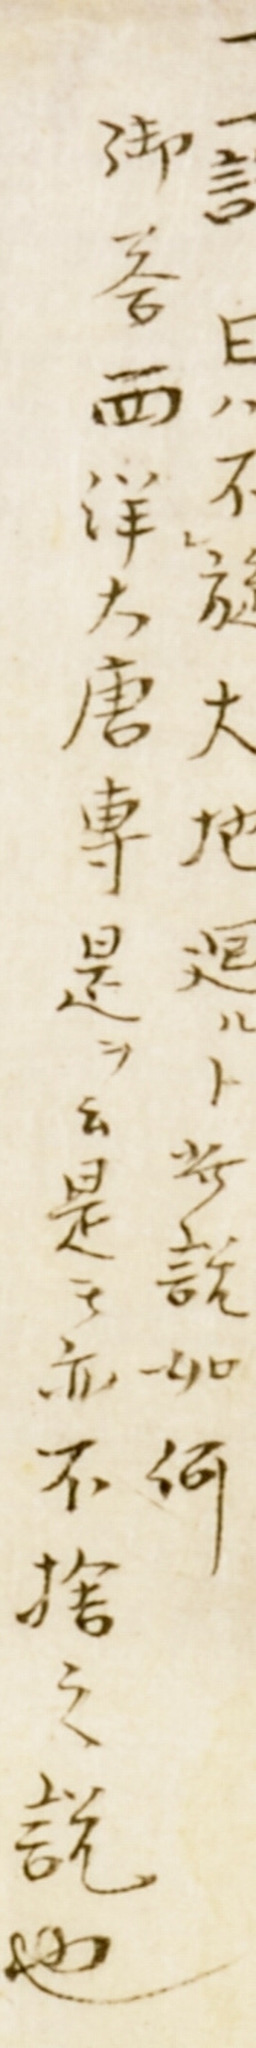御答西洋大唐専是ヲ云亦不捨之説也
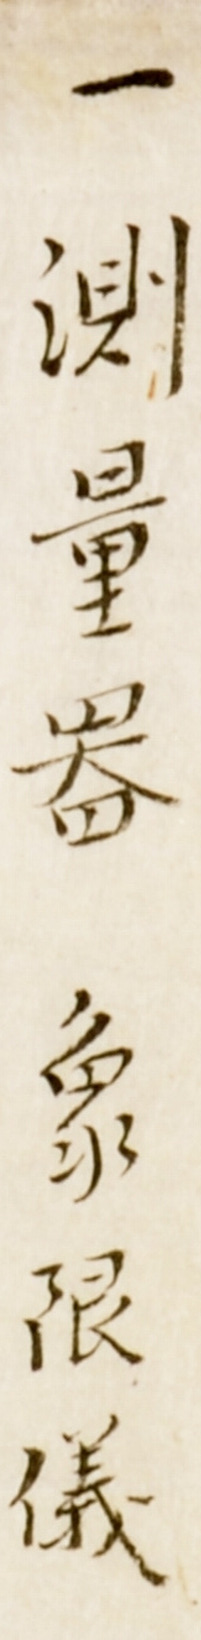一測量器象限儀
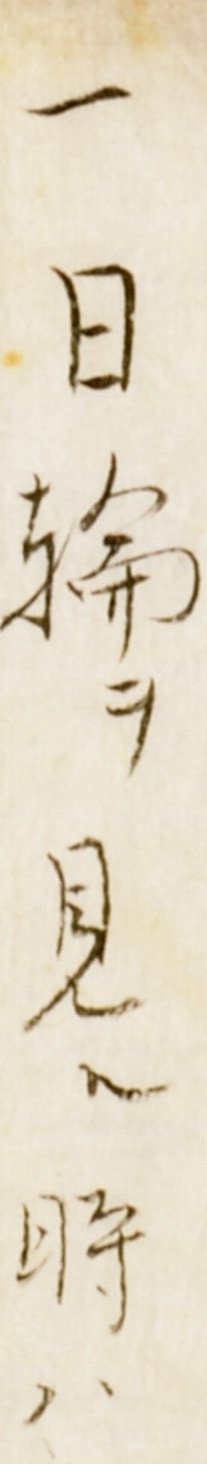一日輪ヲ見ル時ハ
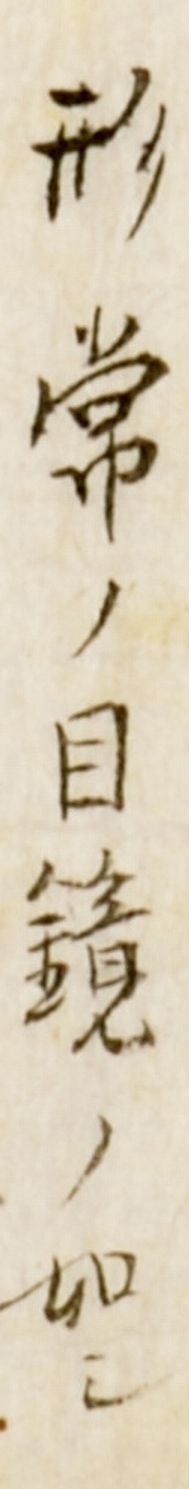形常ノ眼鏡ノ如シ

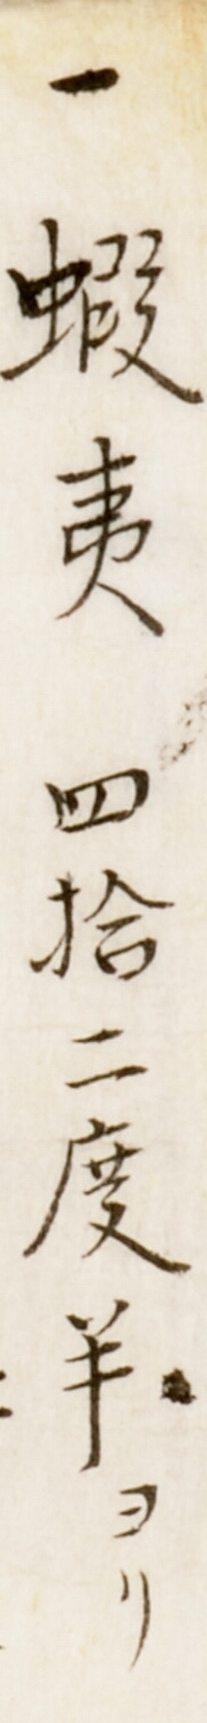蝦夷四拾二度半ヨリ
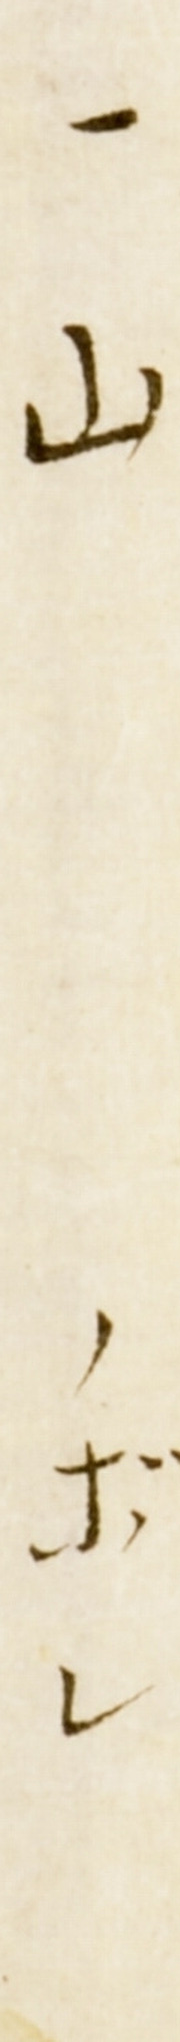一山ノボレ
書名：御測量覚書
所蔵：伊那市立高遠町図書館・合同会社AMANE
